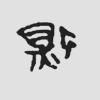則
